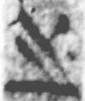之
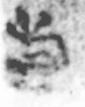○（旗）
